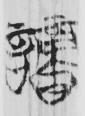謫
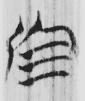於
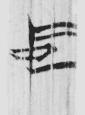𠁩
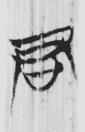君
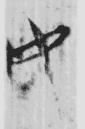女
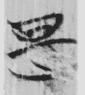是
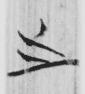之
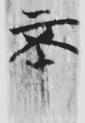不
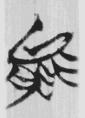能
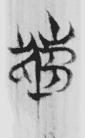茅
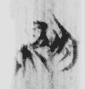則
